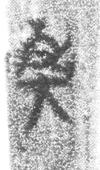樂
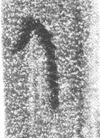人
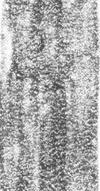之
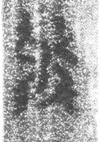器
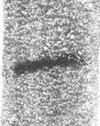一
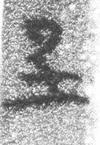坐
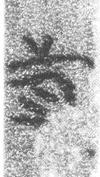前（桟）
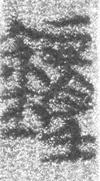鐘（鍾）
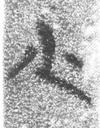少（小）
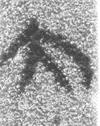大
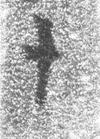十
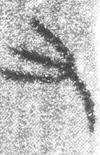又
